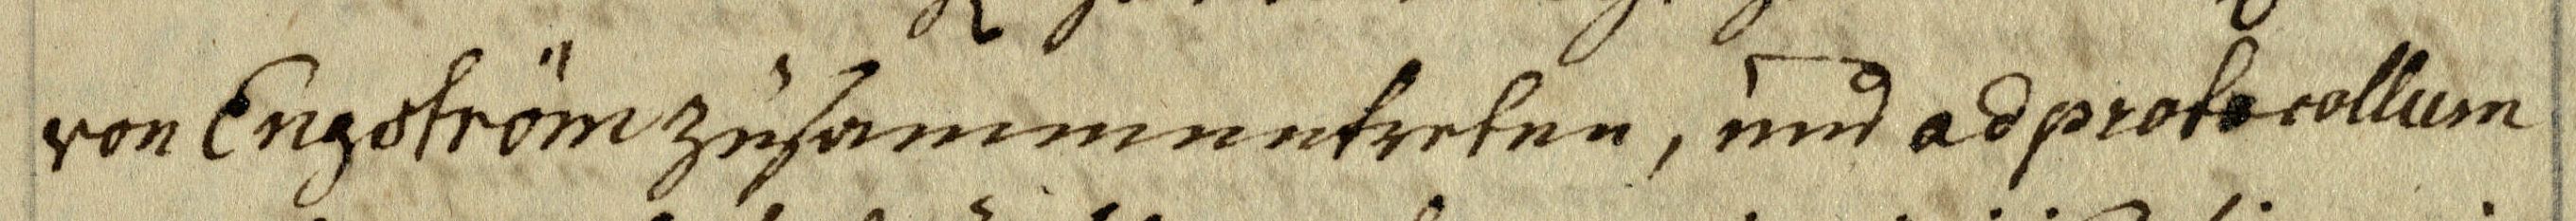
von Engström zusammentreten, und ad protocollum
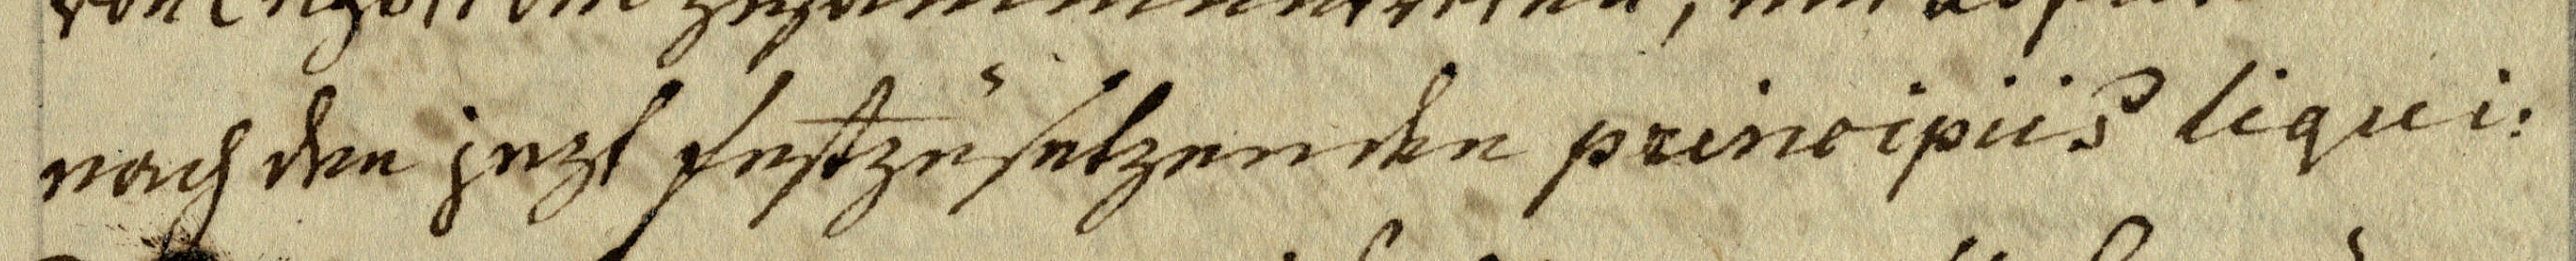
nach dem jezt festzusetzenden principiis liqui¬
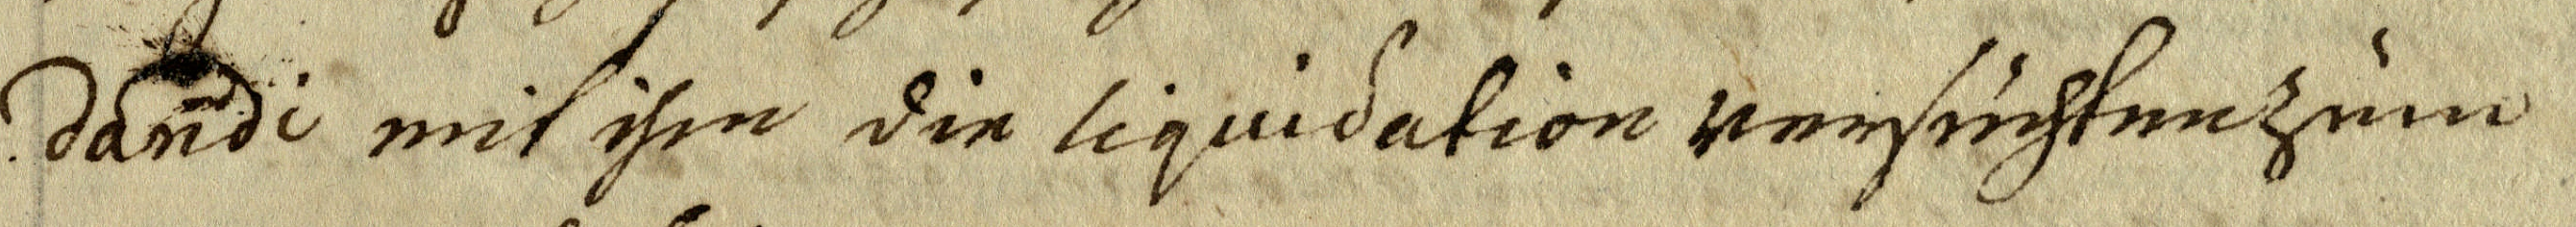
dandi mit ihm die liquidation versuchten zum
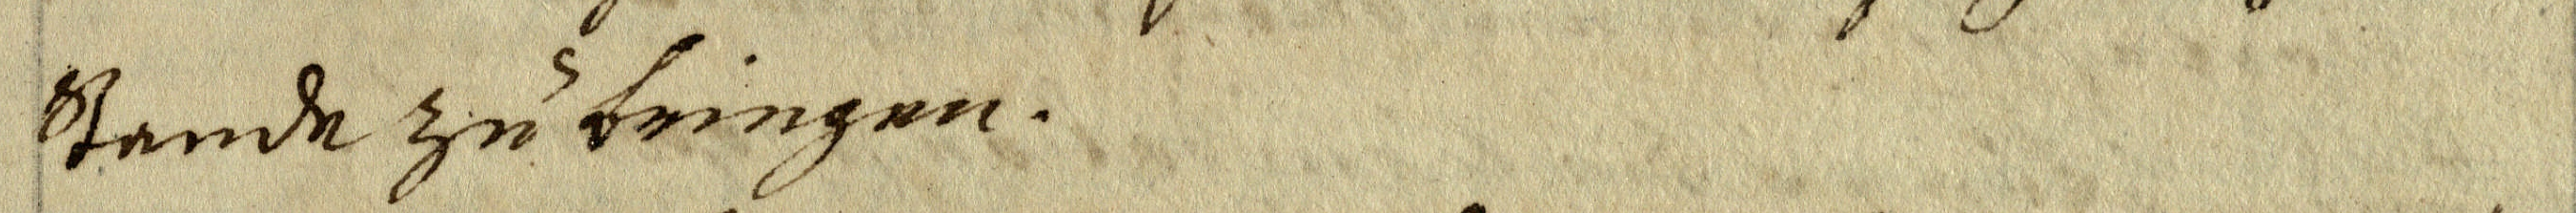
Stande zu bringen.
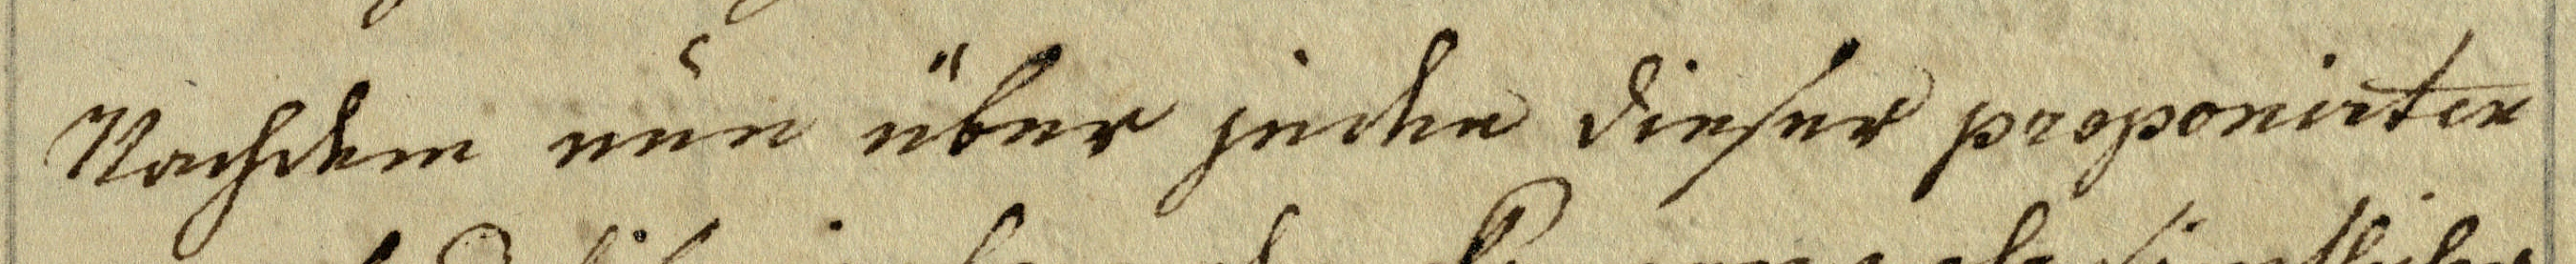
Nachdem nun über jeden dieser proponirten
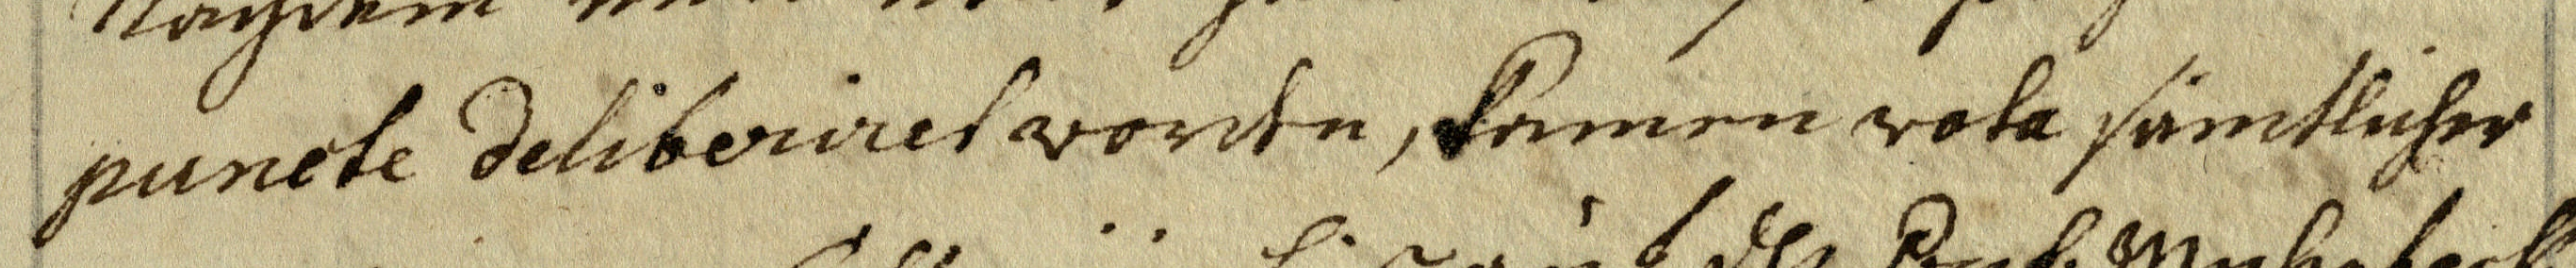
puncte deliberiret worden, kamen vota sämtlicher
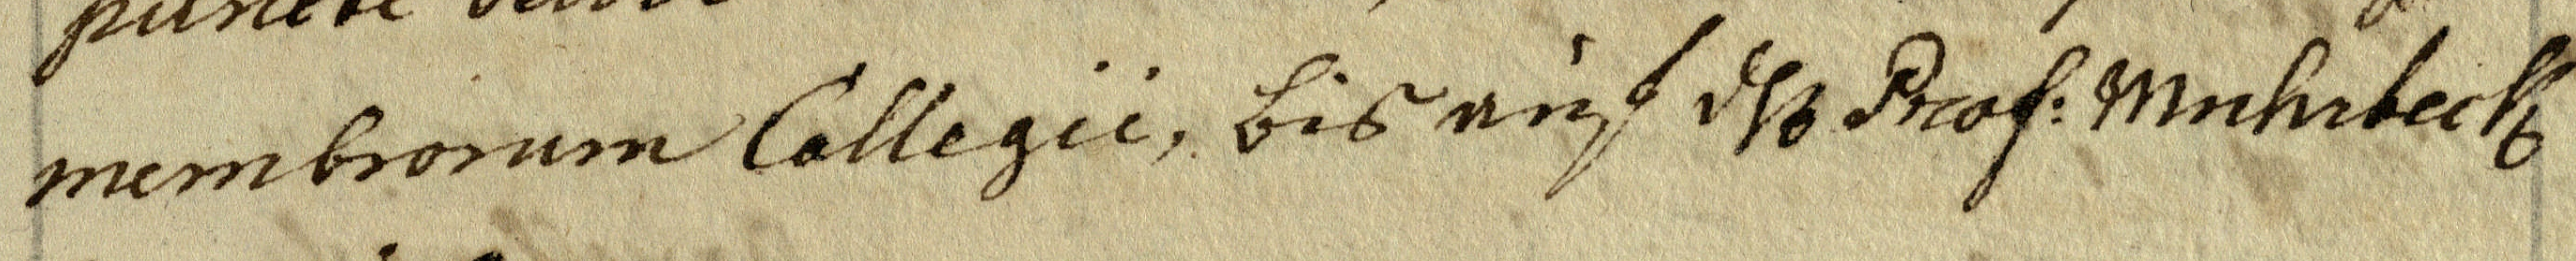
membrorum Collegii, bis auf dh Prof. Muhrbeck
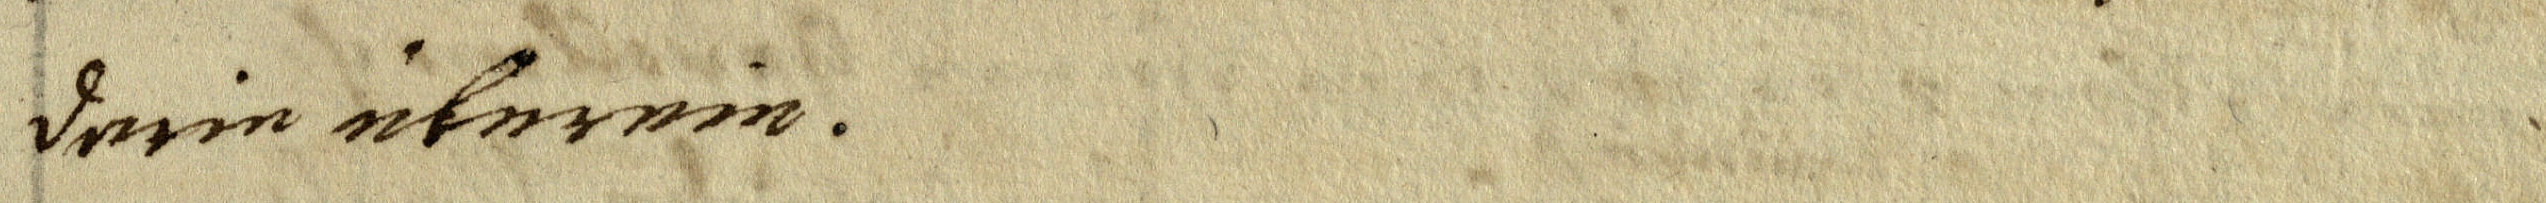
darin überein.
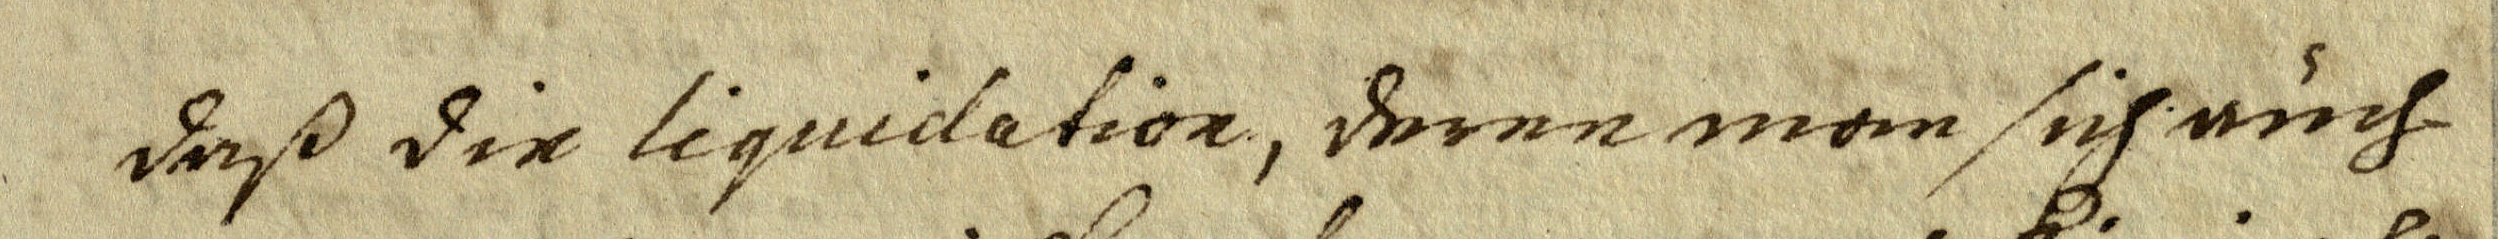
Daß die liquidation, deren man sich auch
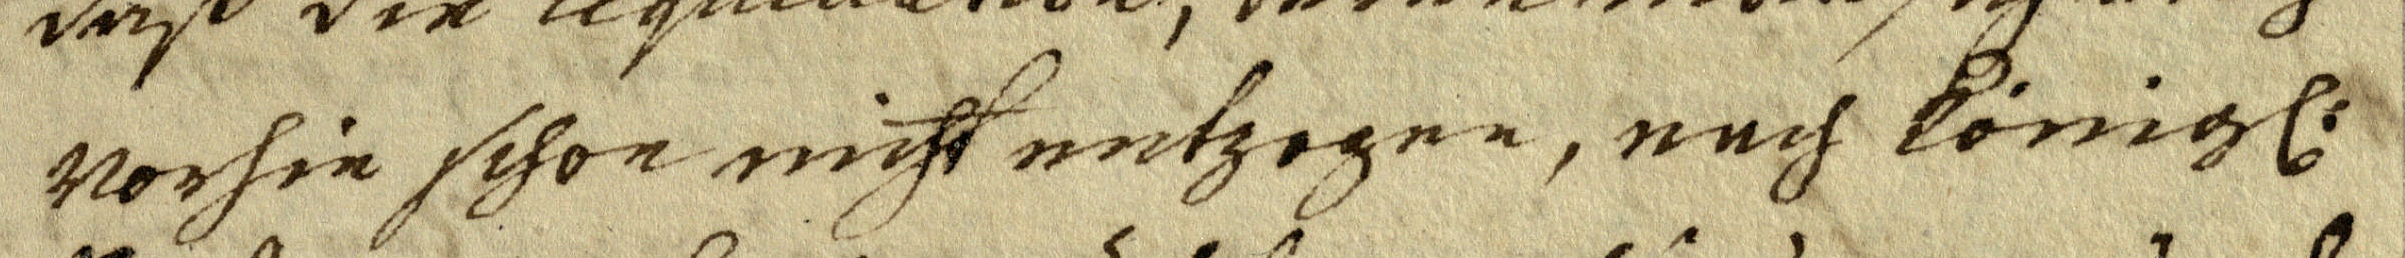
vorhin schon nicht entzogen, nach Königl.
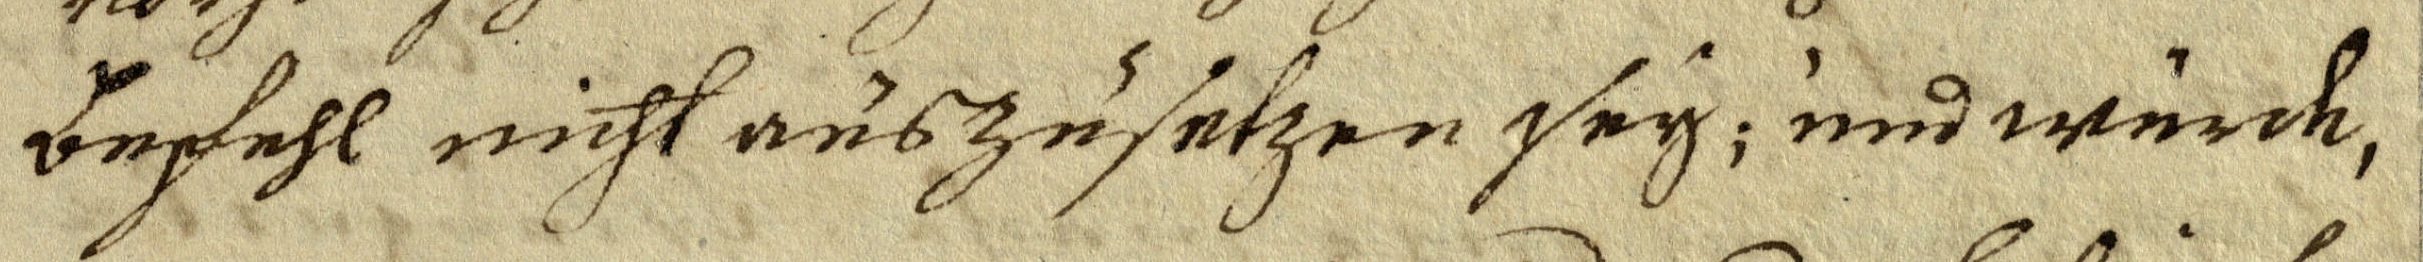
Befehl nicht auszusetzen seÿ; und würde,
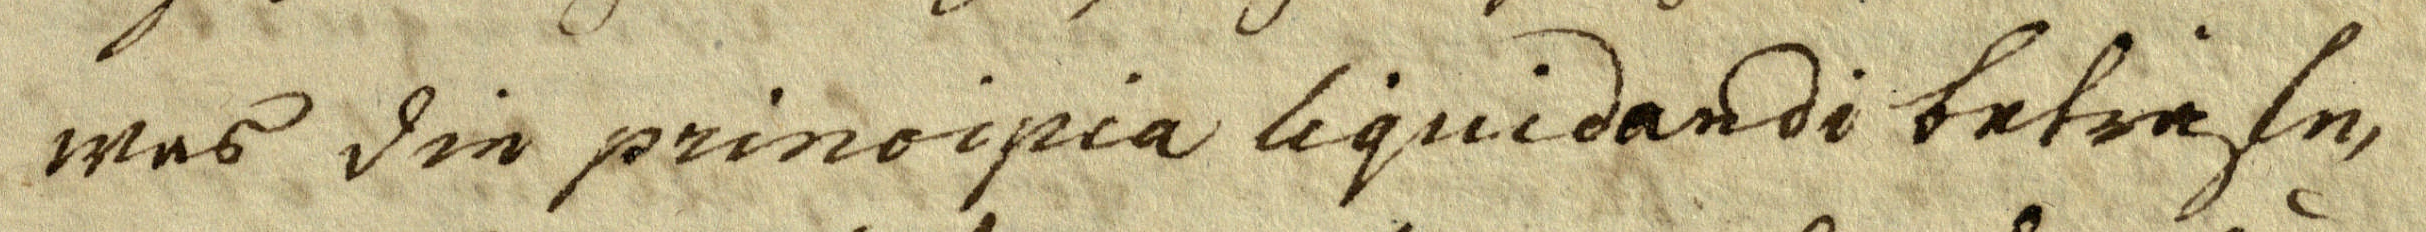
was die principia liquidandi beträfe,
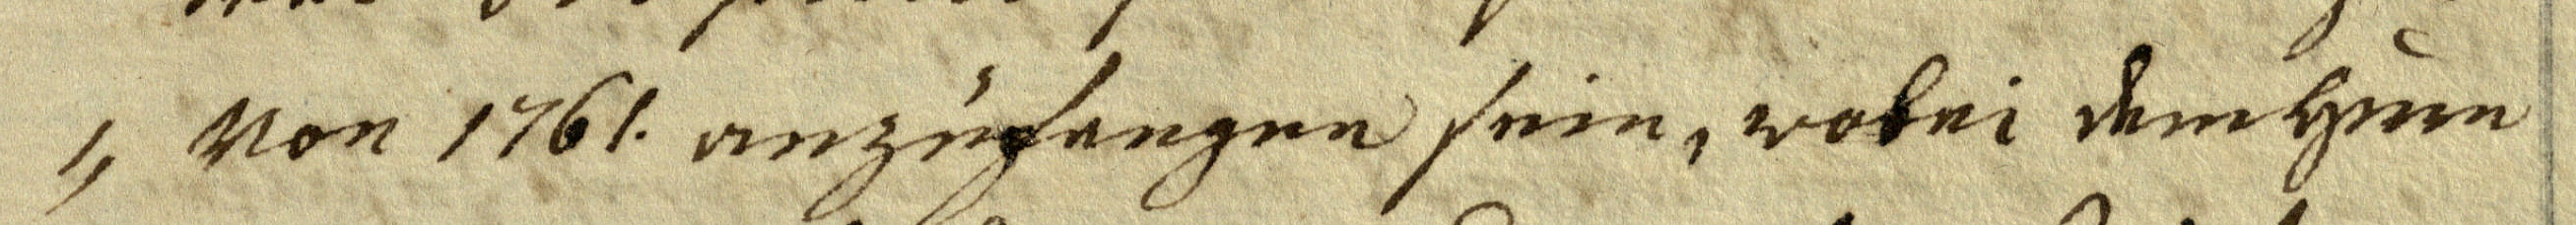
1, von 1761. anzufangen sein, wobei dem Herrn
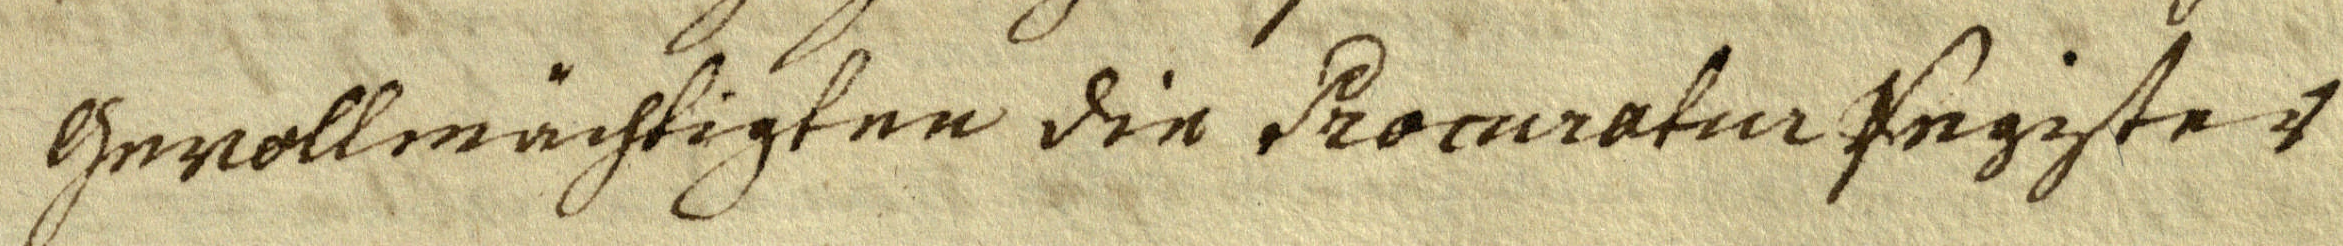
Gevollmächtigten die Procuratur Register
